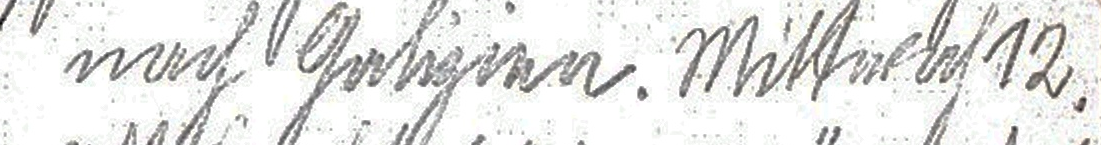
nach Galizien. Mittwoch 12.
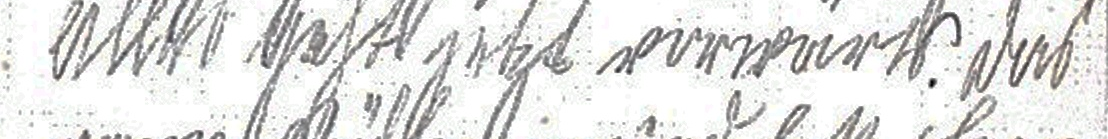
Alles geht jetzt vorwärts. Das
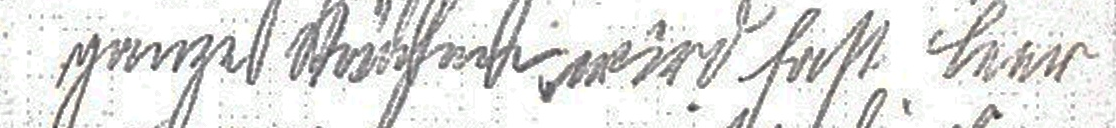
ganze xy wird fast leer
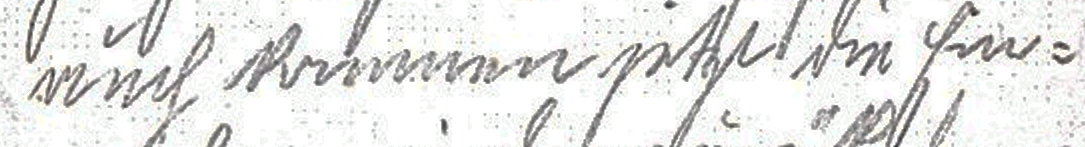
auch kommen jetzt die xy
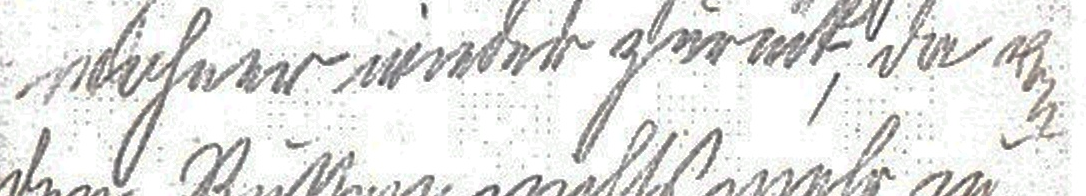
xy wieder zurück, da von
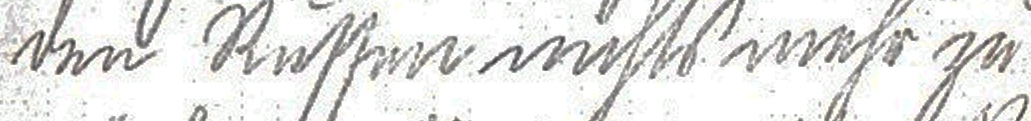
den Russen nichts mehr zu
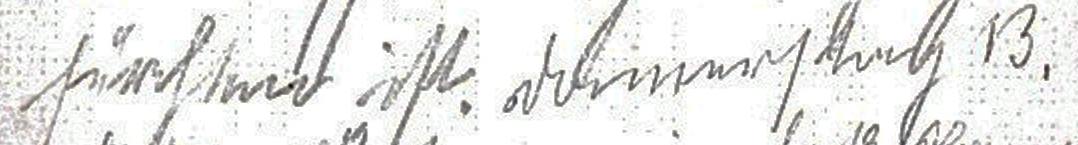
fürchten ist. Donnerstag 13.
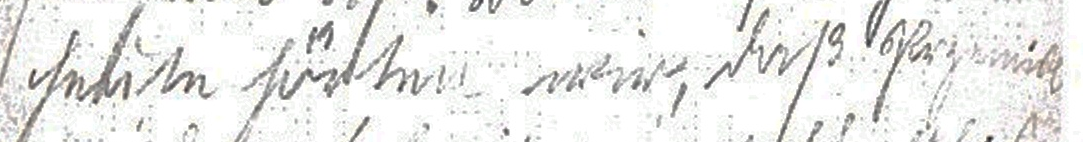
heute hörten wir, daß Przemysl
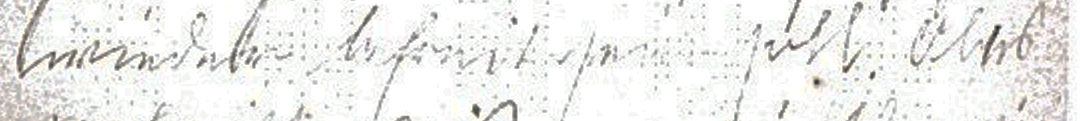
wieder befreit sein soll. Ob es
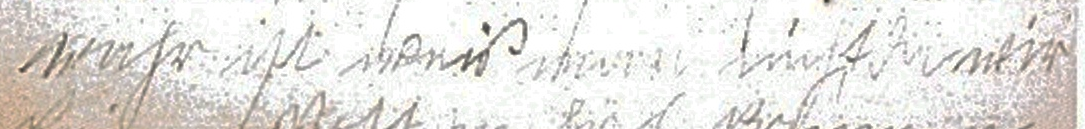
wahr ist weis man nicht, da wir
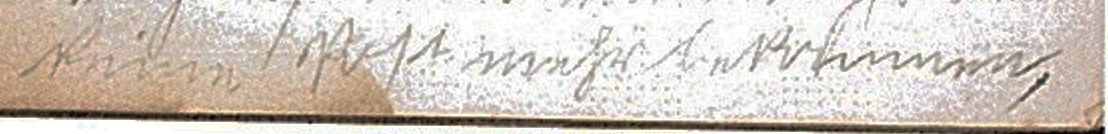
keine Post mehr bekommen,
